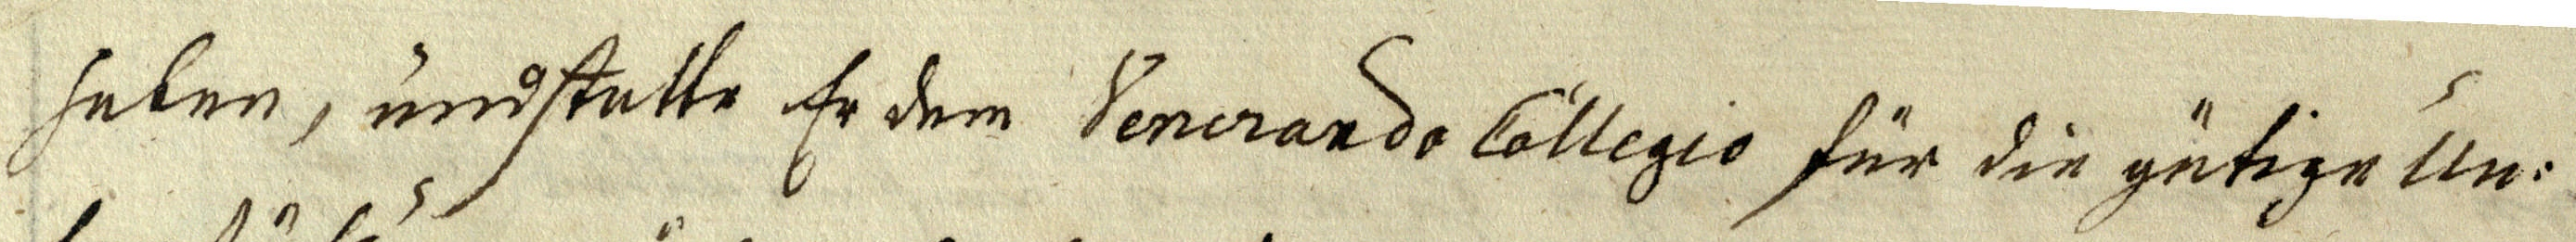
haben, und statte Er dem Venerando Collegio für die gütige Un¬
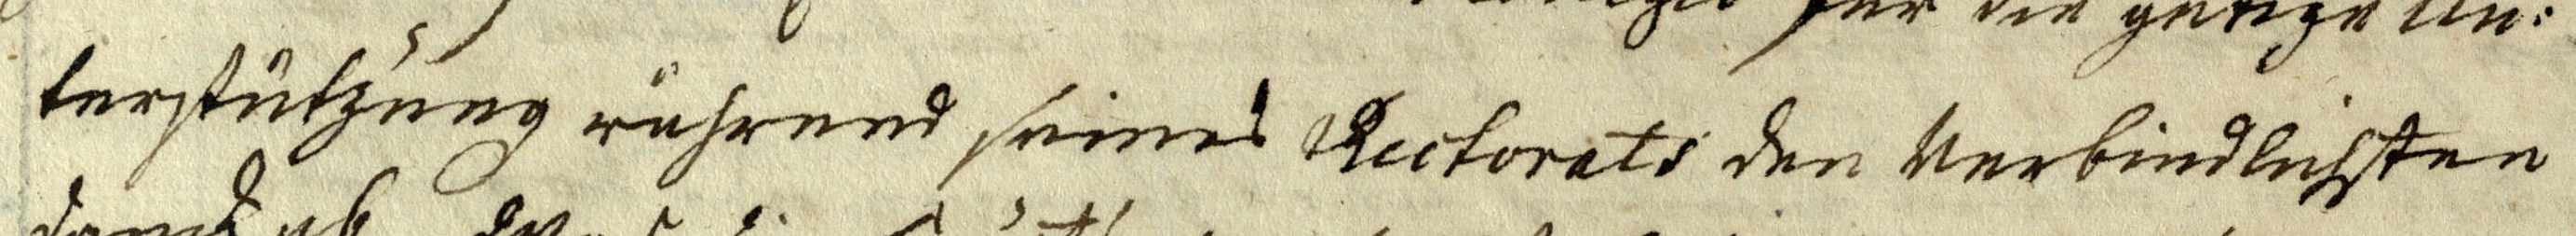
terstützung während seines Rectorats den verbindlichsten
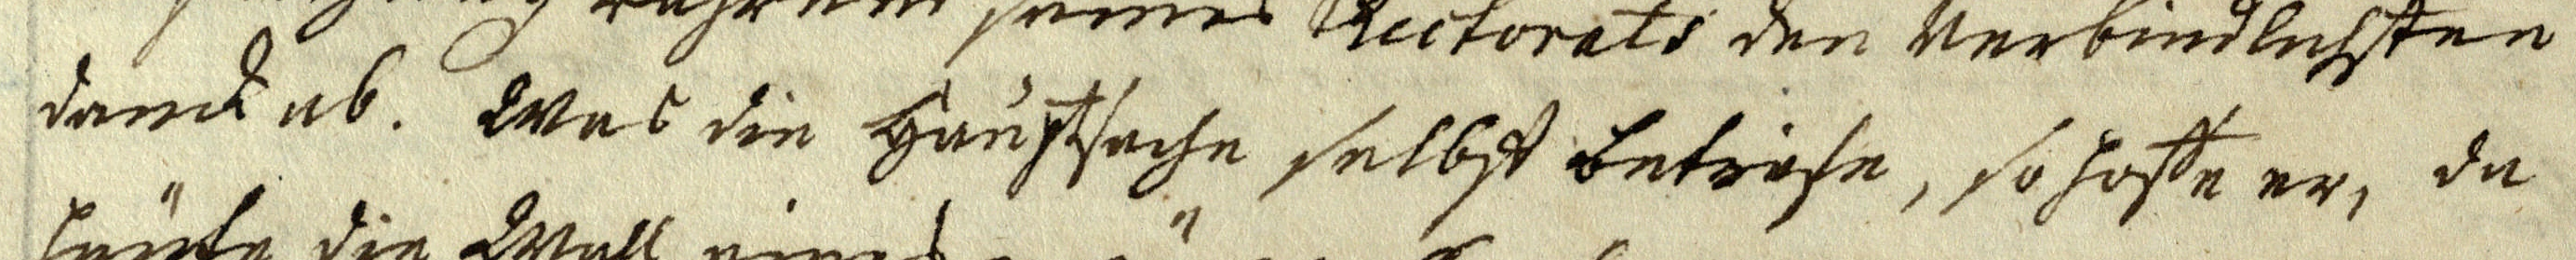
Danck ab. Was die Hauptsache selbst beträfe, so hoffe er, da
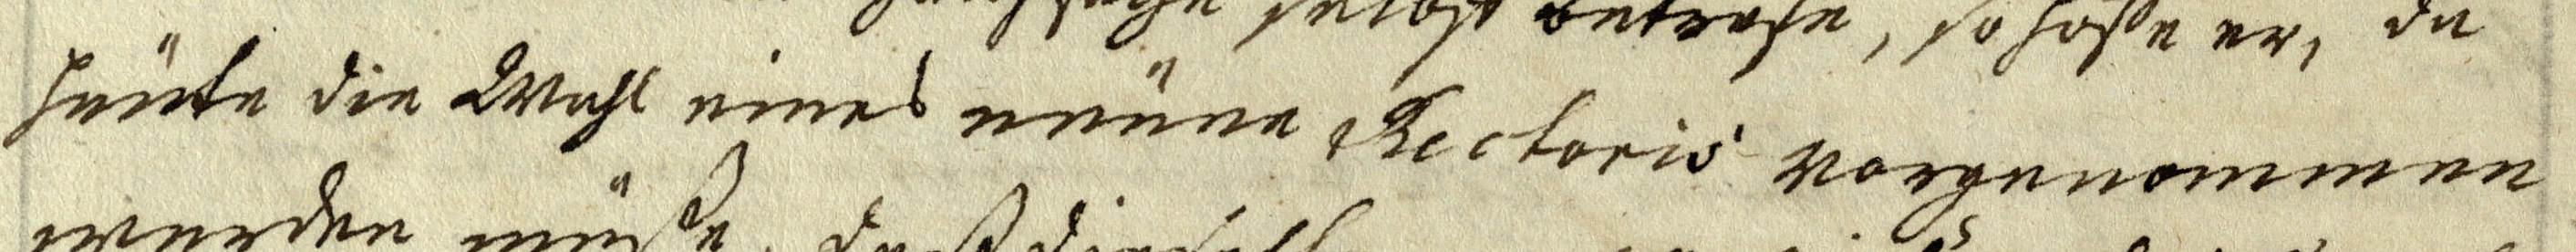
heute die Wahl eines neuen Rectoris vorgenommen
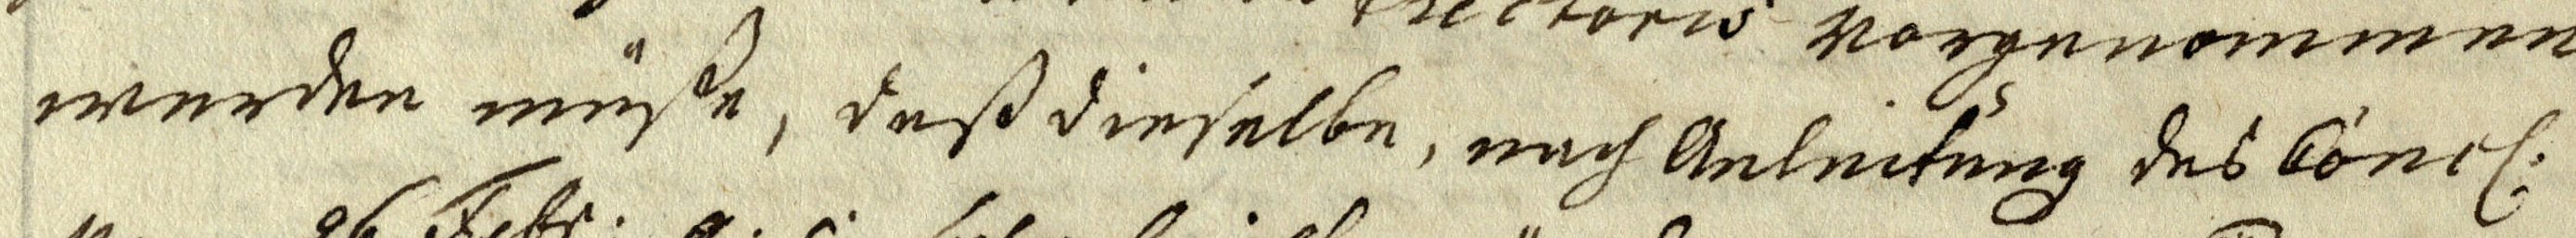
werden müße, daß dieselbe, nach Anleitung des Concl.
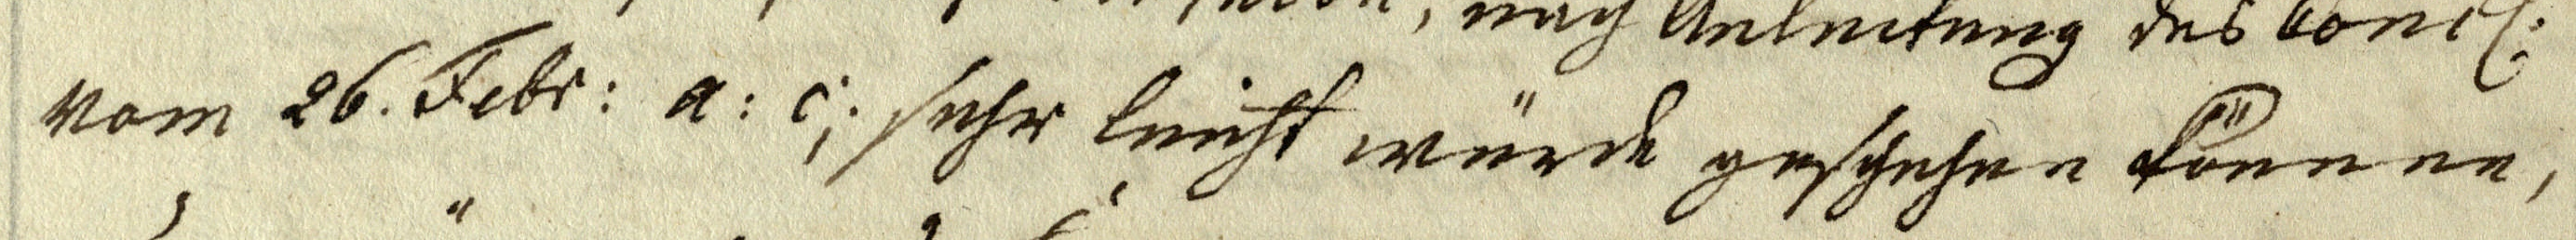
vom 26. Febr. a. c. , sehr leicht würde geschehen können,
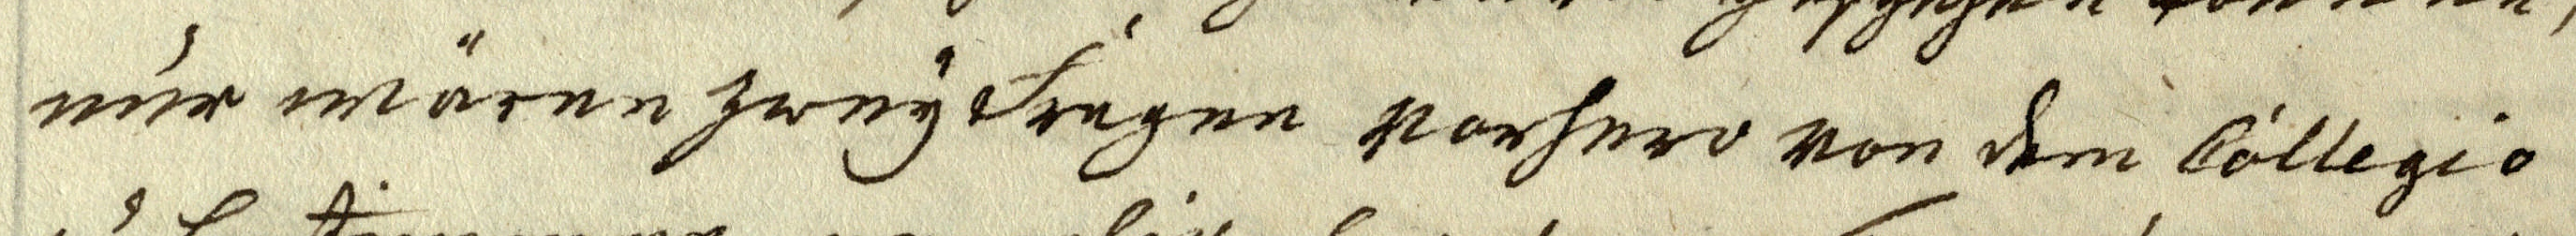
nur wären zweÿ Fragen vorhero von dem Collegio
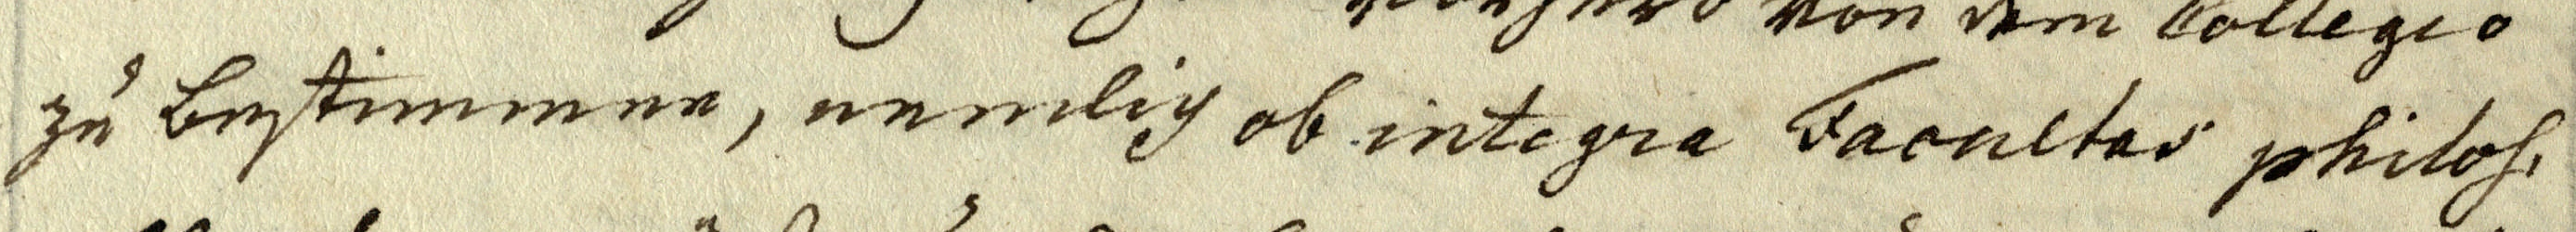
zu bestimmen, nemlich ob integre Facultas philos.
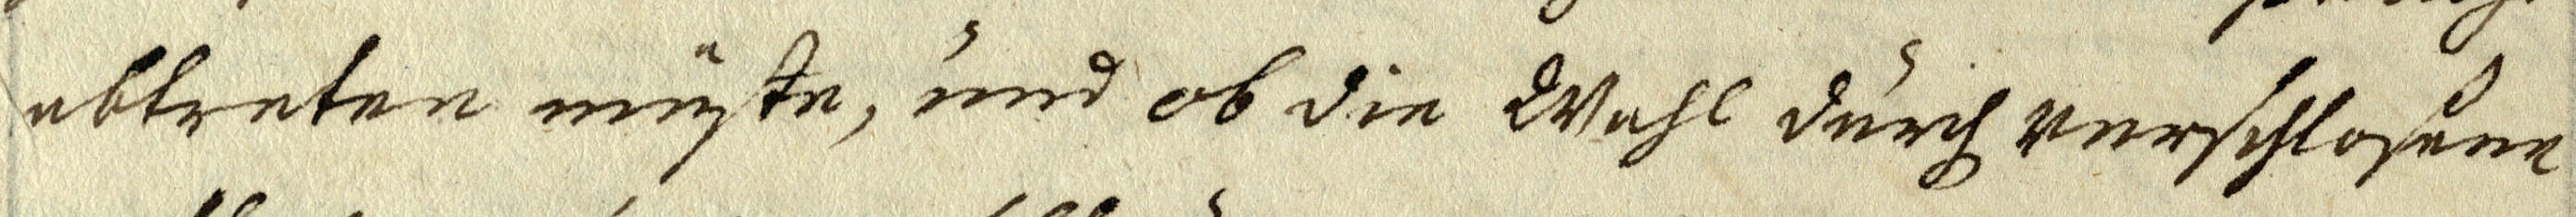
abtreten müste, und ob die Wahl durch verschloßene
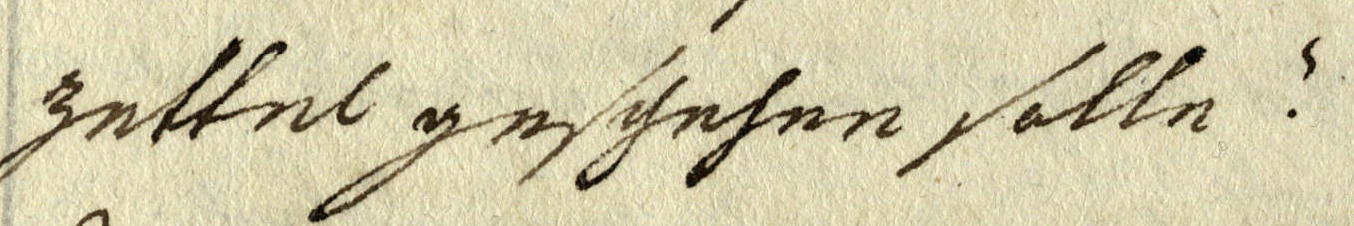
Zettel geschehen solle?
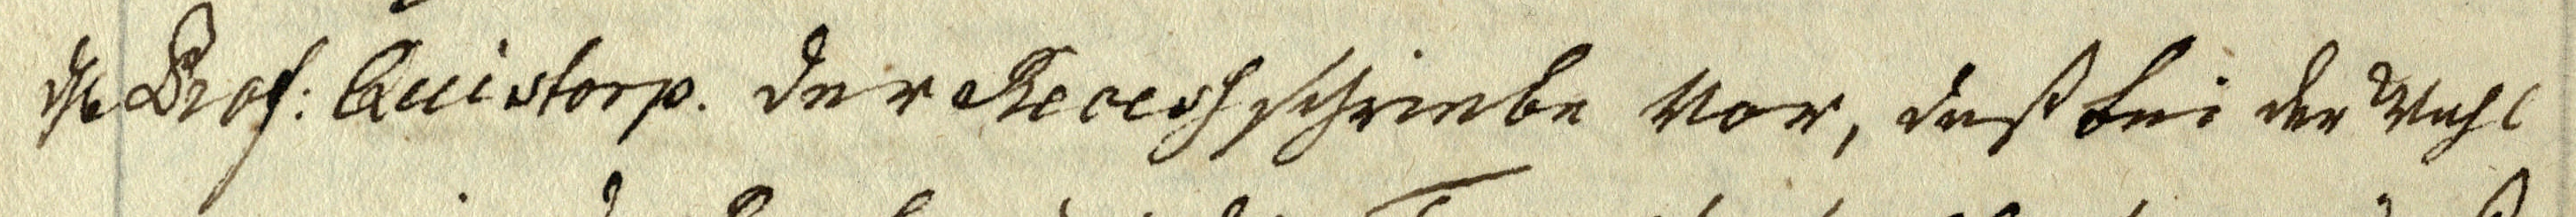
dh Prof. Quistorp. der Recess schriebe vor, daß bei der Wahl
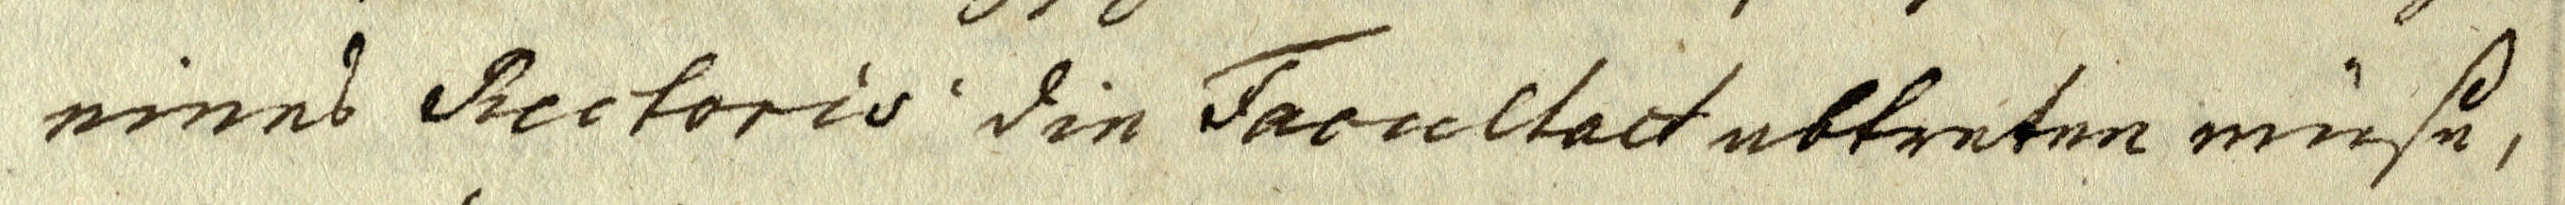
eines Rectoris die Facultaet abtreten müße,
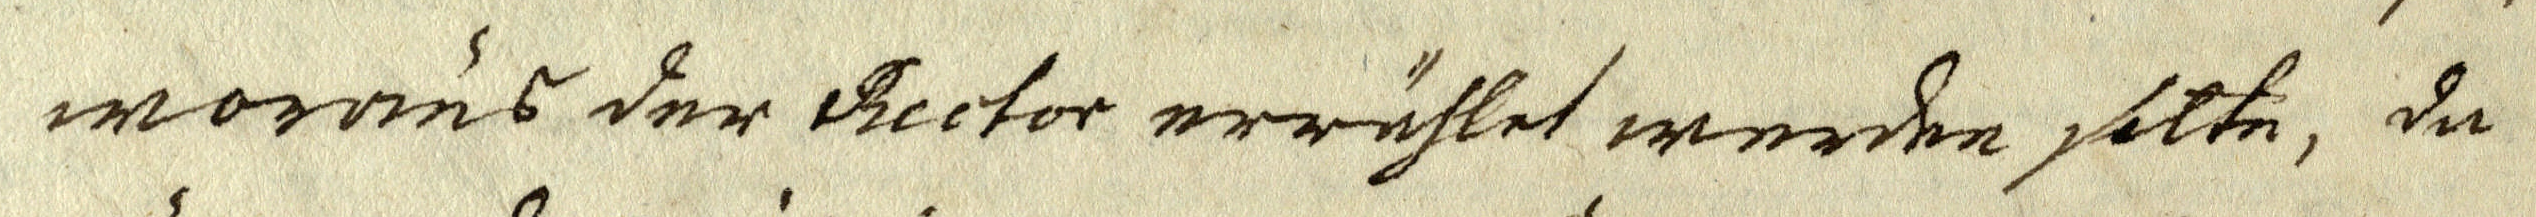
woraus der Rector erwählet werden solte, da
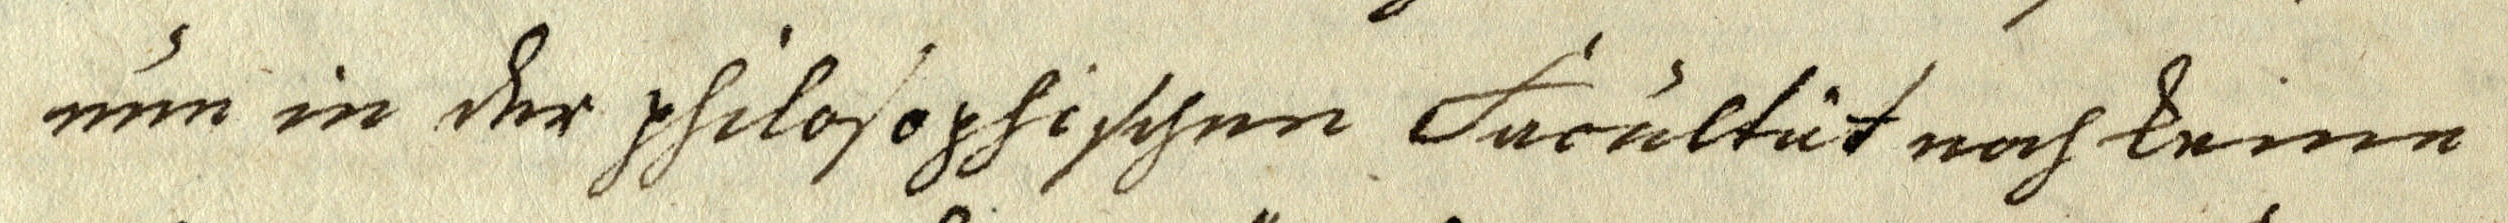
nun in der philosophischen Facultät noch keine
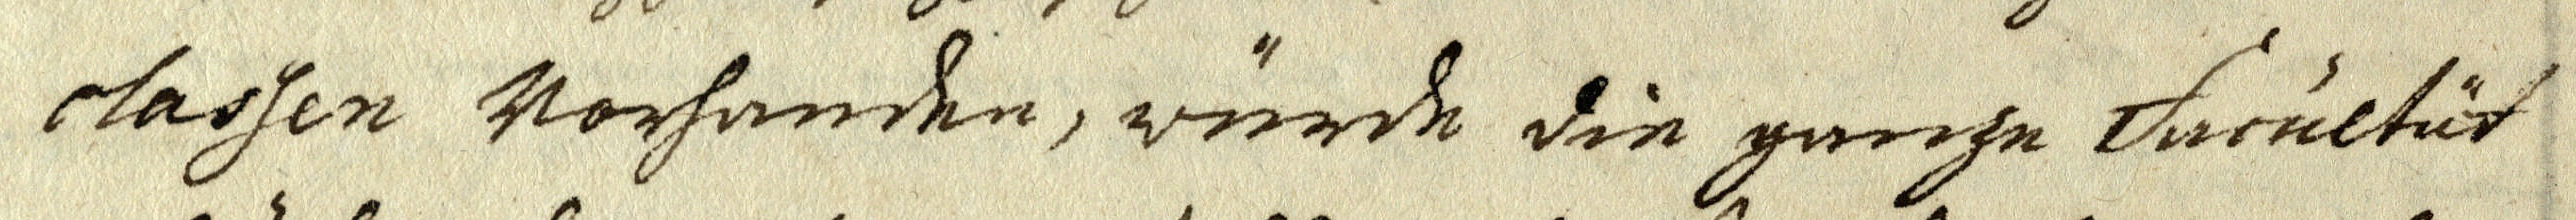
classen vorhanden, würde die ganze Facultät
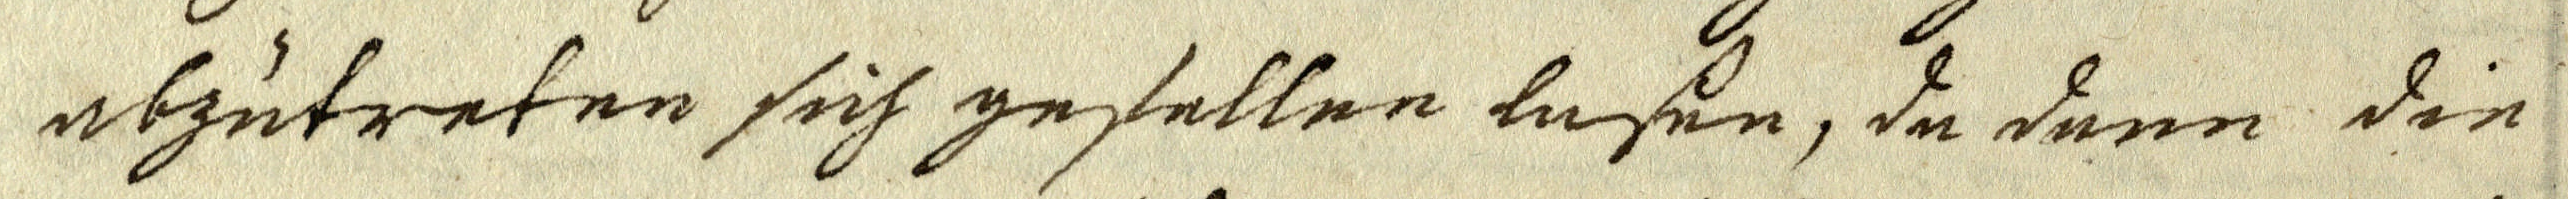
abzutreten sich gefallen laßen, da dann die
